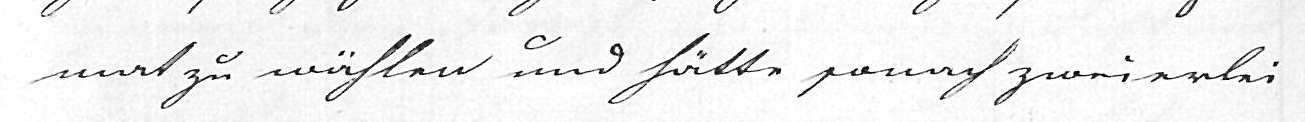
mat zu wählen und hätte sonach zweierlei
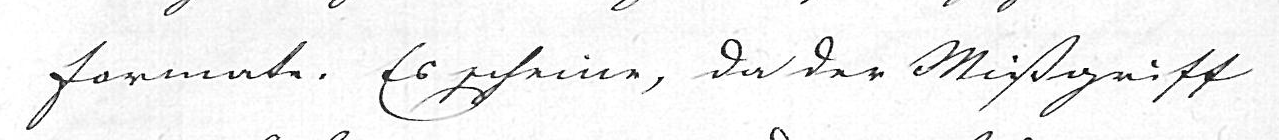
Formate. Es scheine, da der Mißgriff
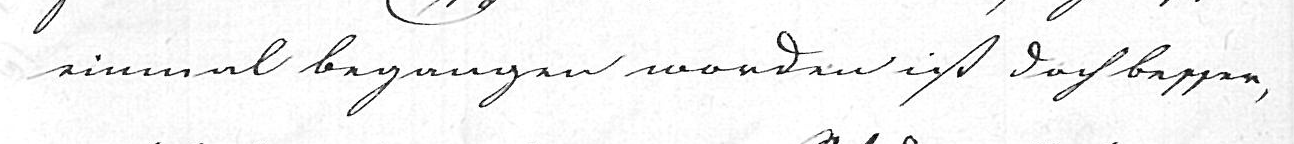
einmal begangen worden ist doch besser,
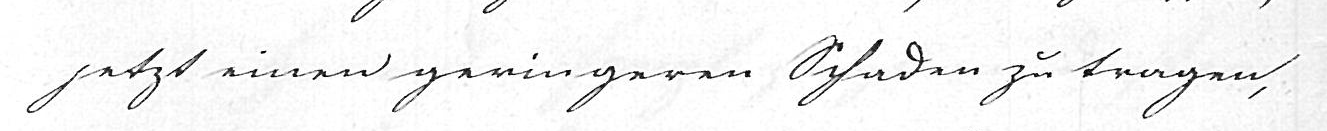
jetzt einen geringeren Schaden zu tragen,
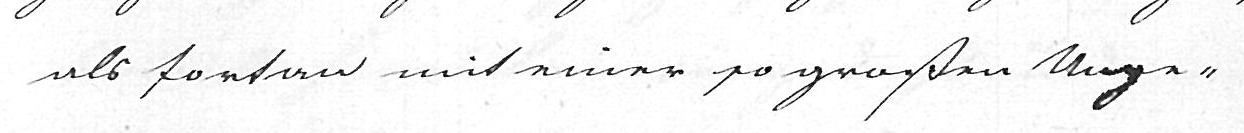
als fortan mit einer so großen Unge-
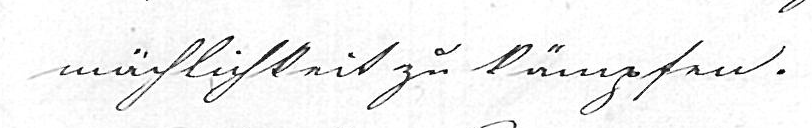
mächlichkeit zu kämpfen.
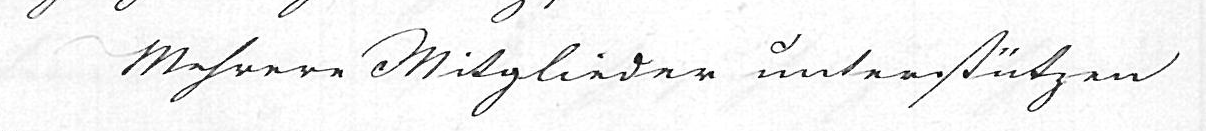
Mehrere Mitglieder unterstützen
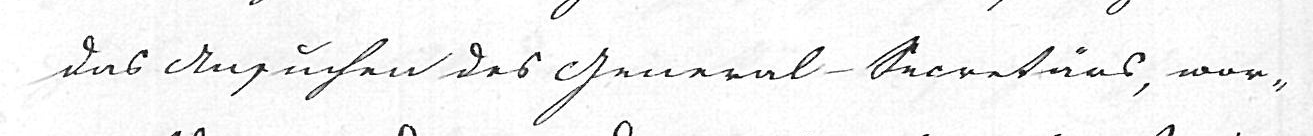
das Ansuchen des General-Secretärs, wor-
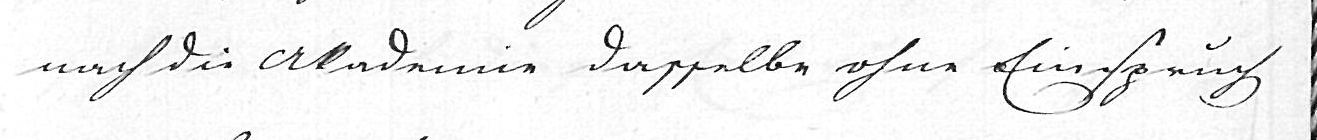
nach die Akademie dasselbe ohne Einspruch
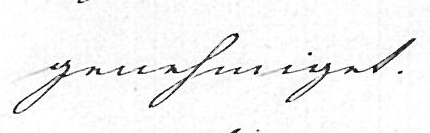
genehmiget.
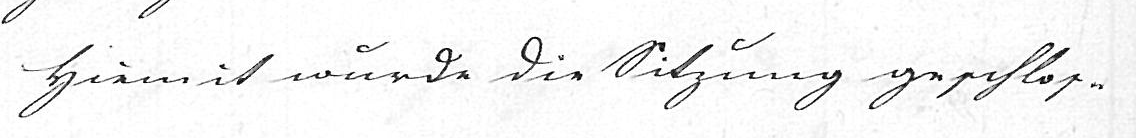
Hiemit wurde die Sitzung geschlos-
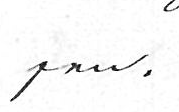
sen.
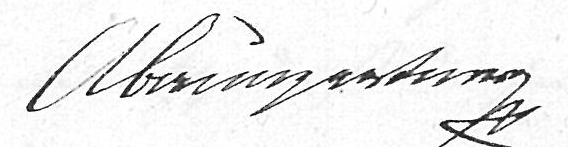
ABaumgartner
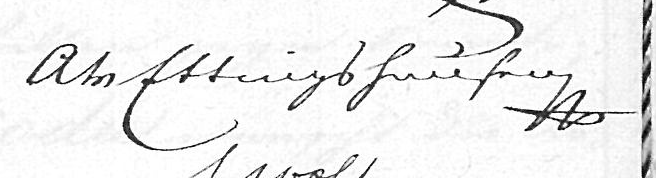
AvEttingshausen
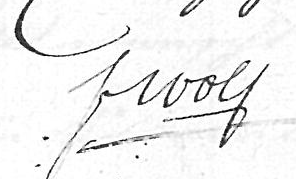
FWolf
